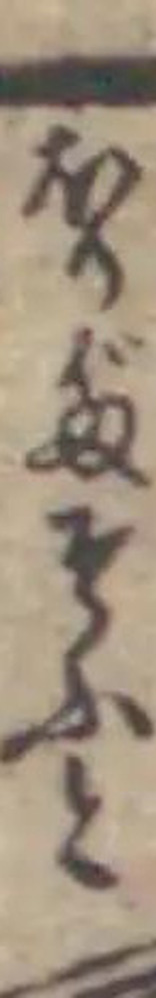ほりだそふと
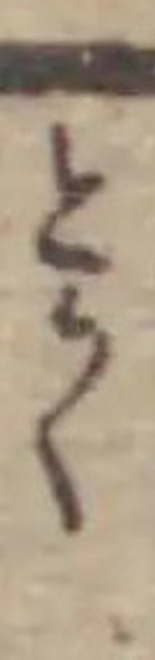とかく
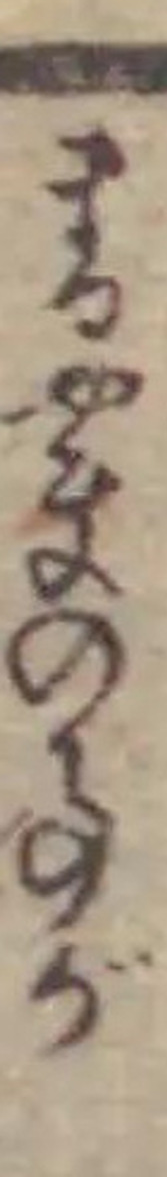まるやまの事が
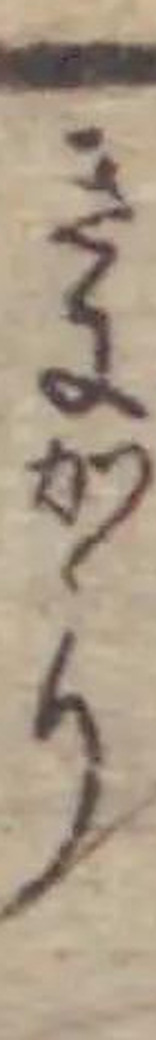きにかゝり
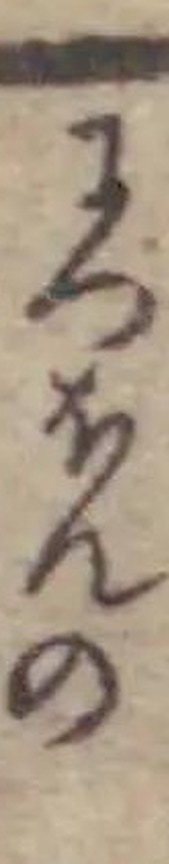につほんの
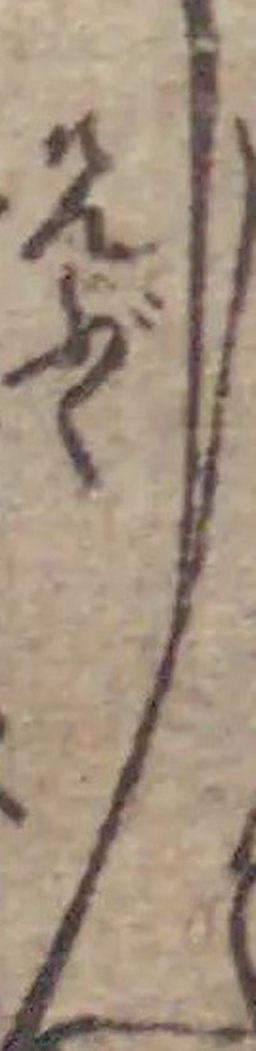けんぶく
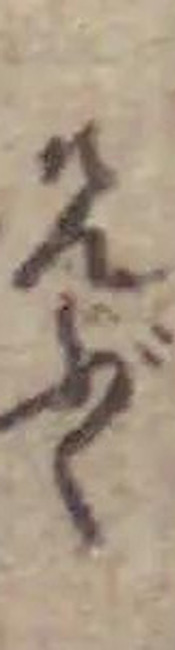けんぶく
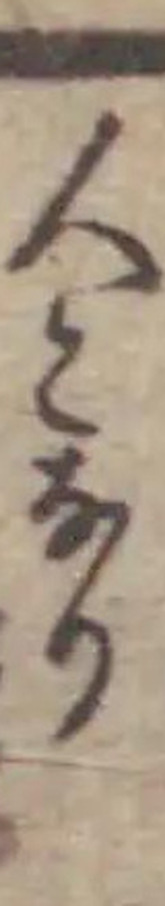人となり
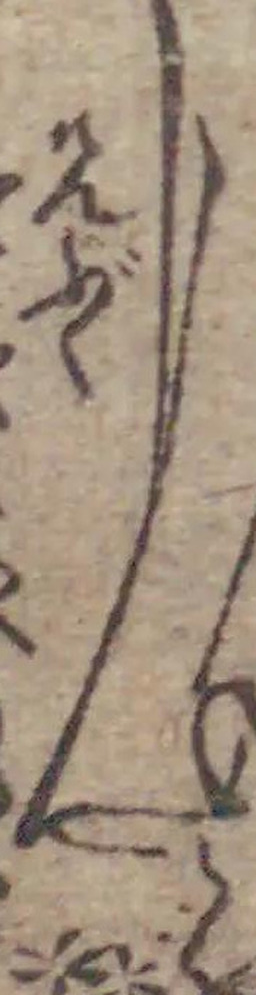けんぶく
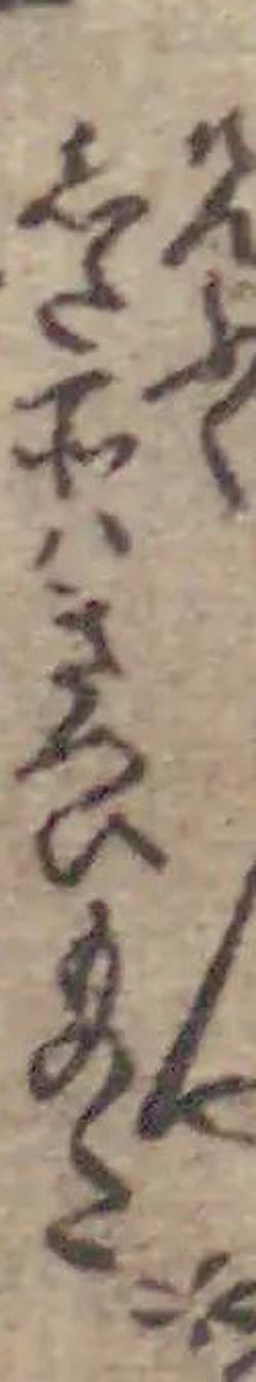した所はきついものた
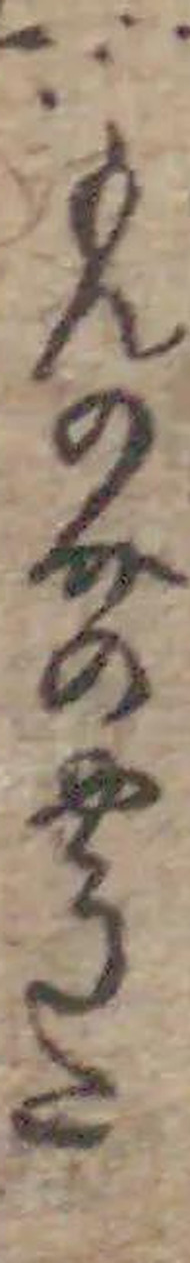もんの介のやうた

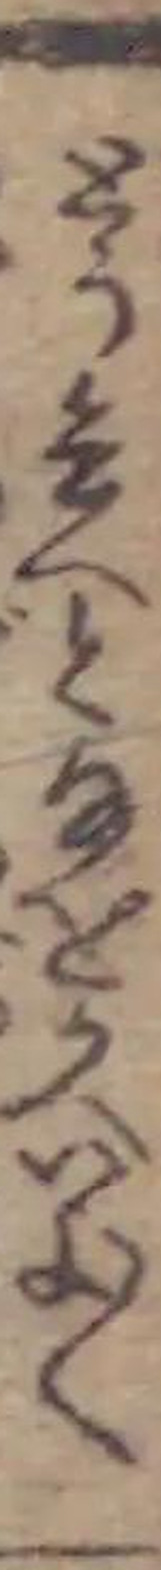とう兵へとなをかへいよ〳〵
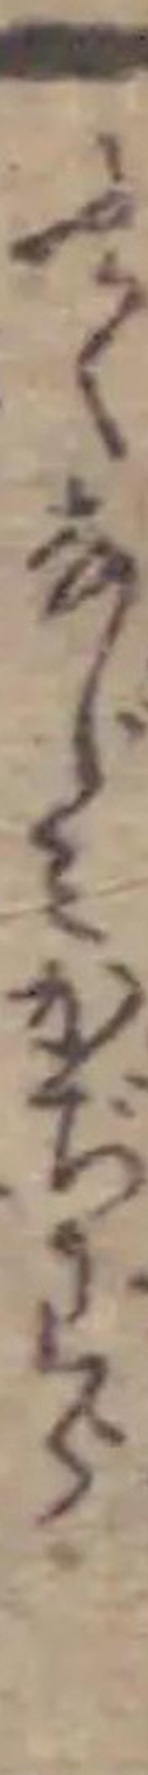ふかくなじみかぢわら
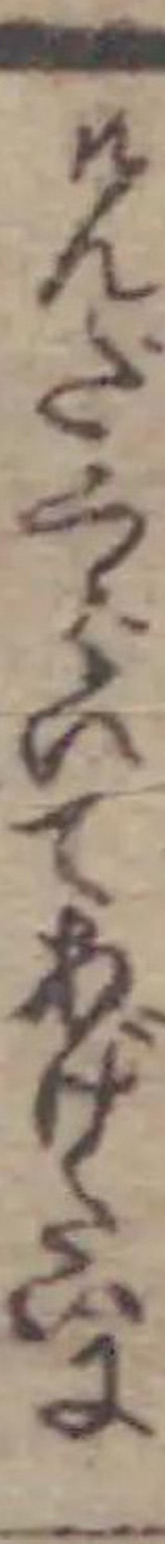けんたくらいてあげたいに
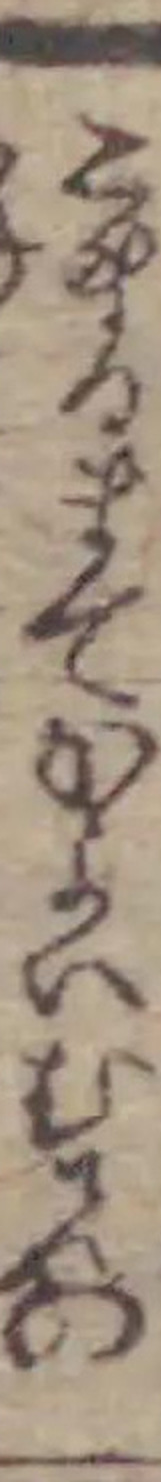こまるまてかよいむけんの
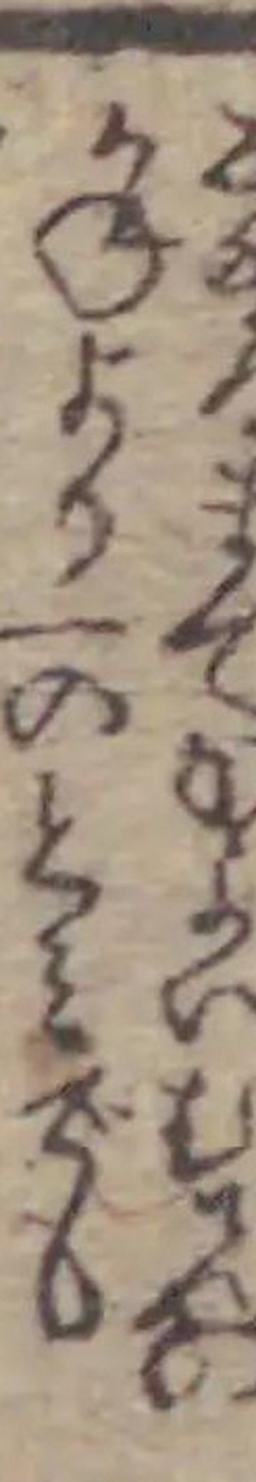かねより一のとみでも
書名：間違月夜鍋 2巻
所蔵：国立国会図書館 National Diet Library, JAPAN
